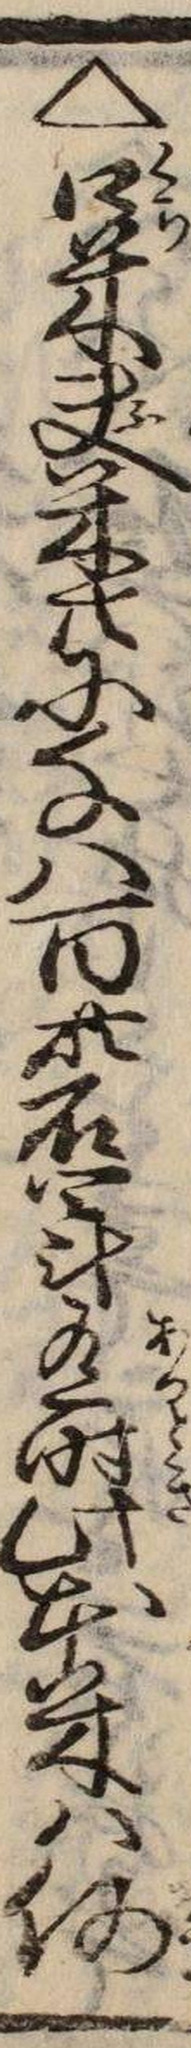△口米夫米共に千八百卅石四斗有時此本米は何
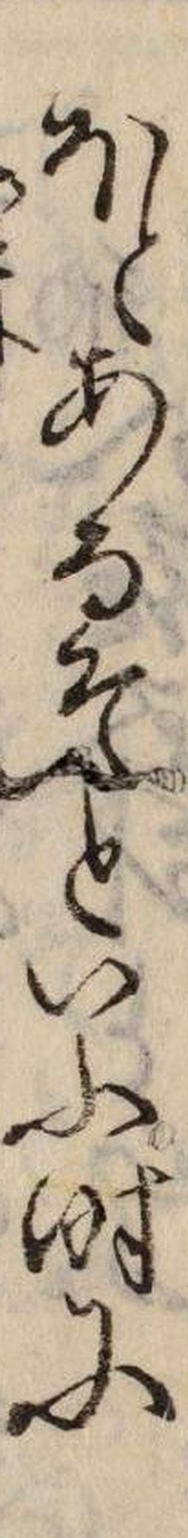ほとあるそといふ時に
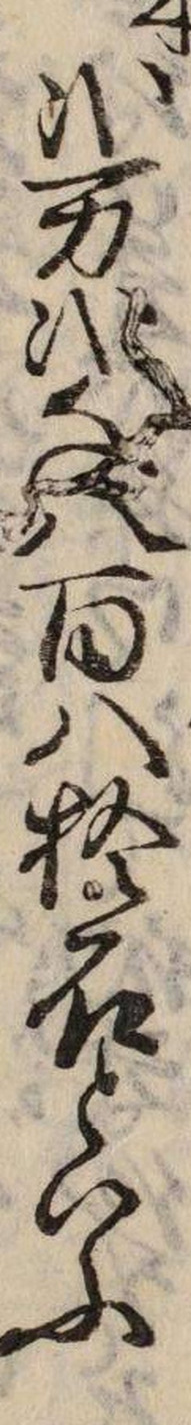本米弐万弐千八百八拾石といふ
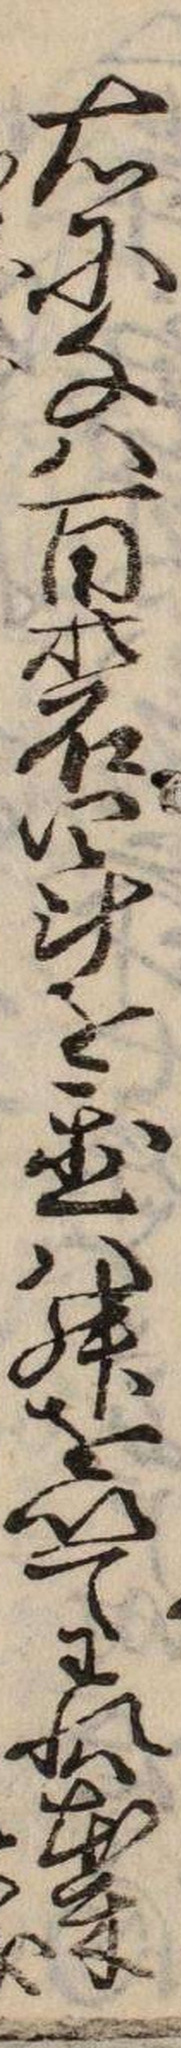右に千八百丗石四斗を置八舛を以てわれは本米と成
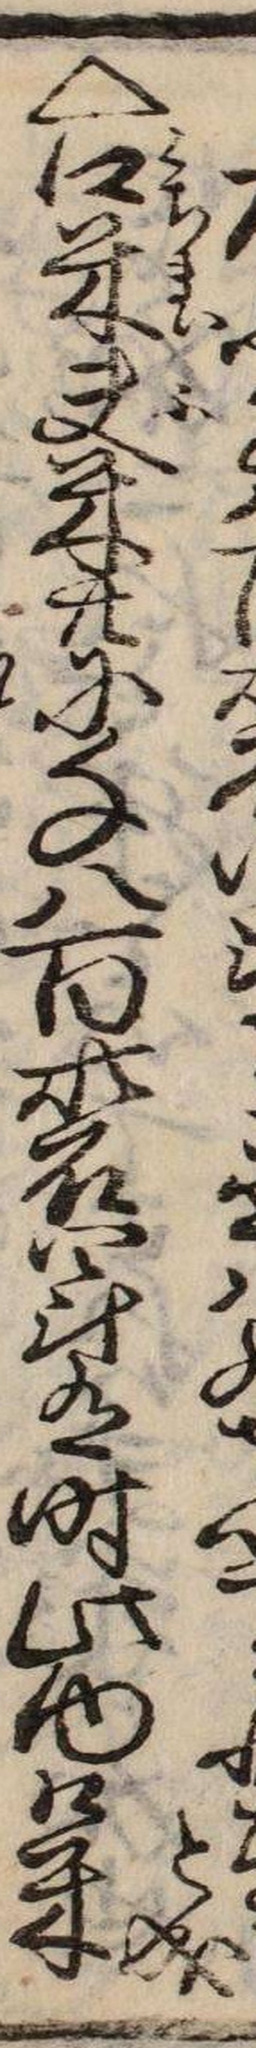△口米夫米共に千八百卅石四斗有時此内口米
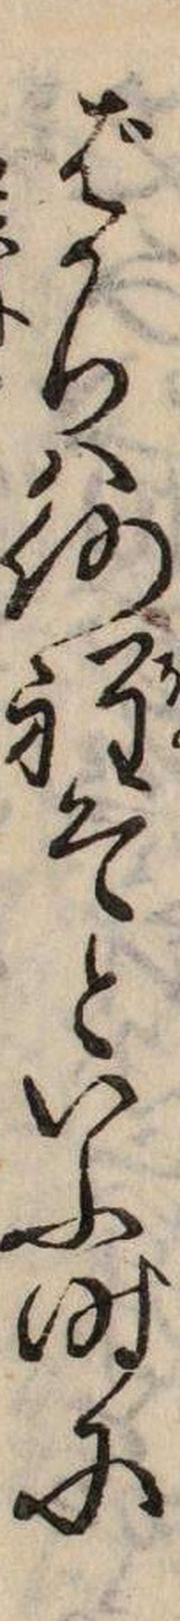ばかりは何程そといふ時に
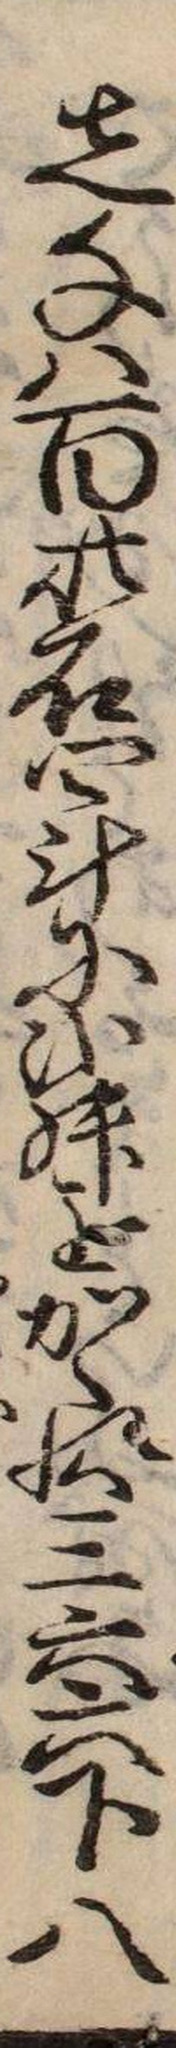先千八百丗石四斗に弐舛をかくれは三六六下八
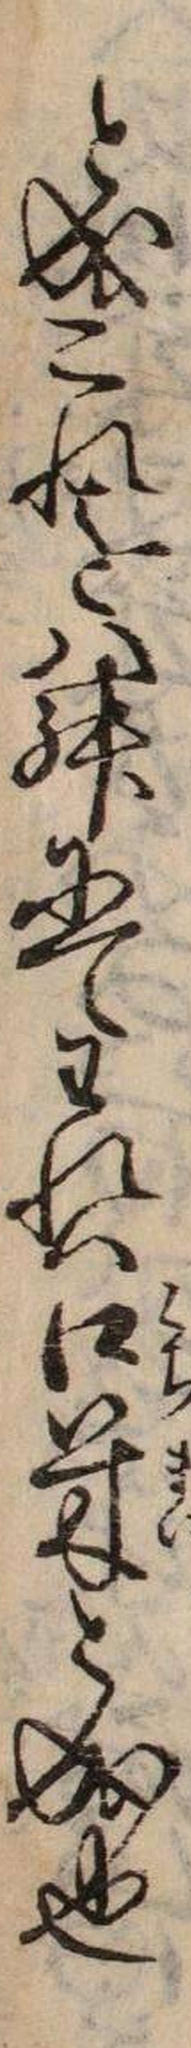と成これを八舛にてわれは口米と成也

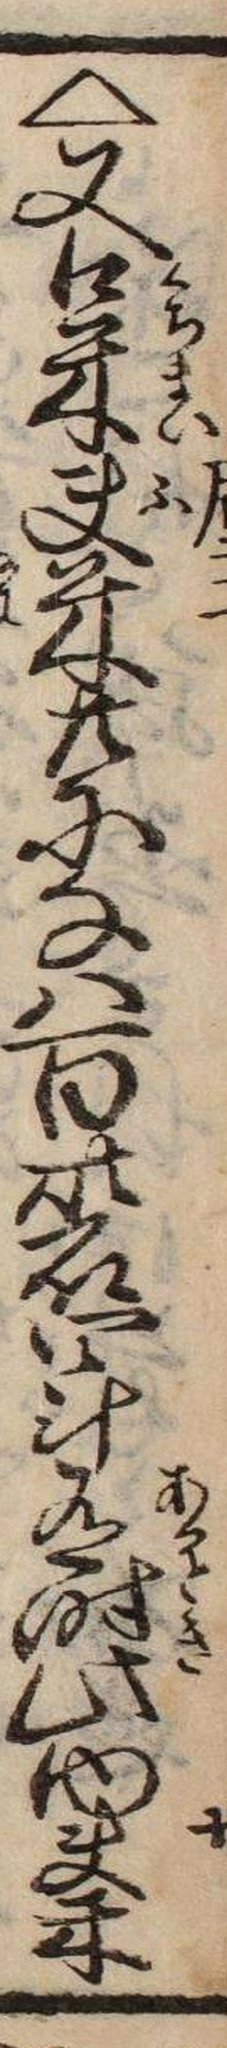△又口米夫米共に千八百卅石四斗有時此内夫米
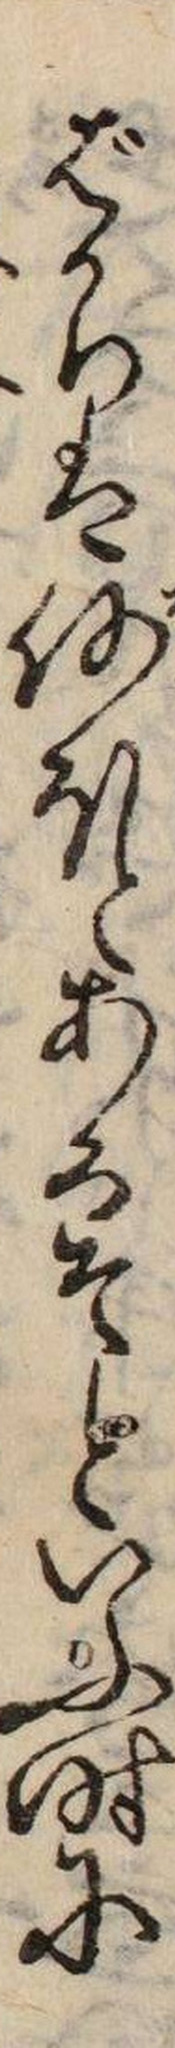ばかりは何ほとあるそといふ時に
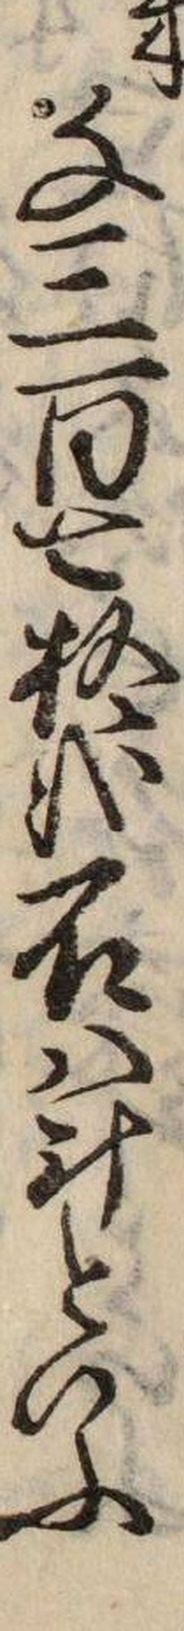夫米千三百七拾弐石八斗といふ
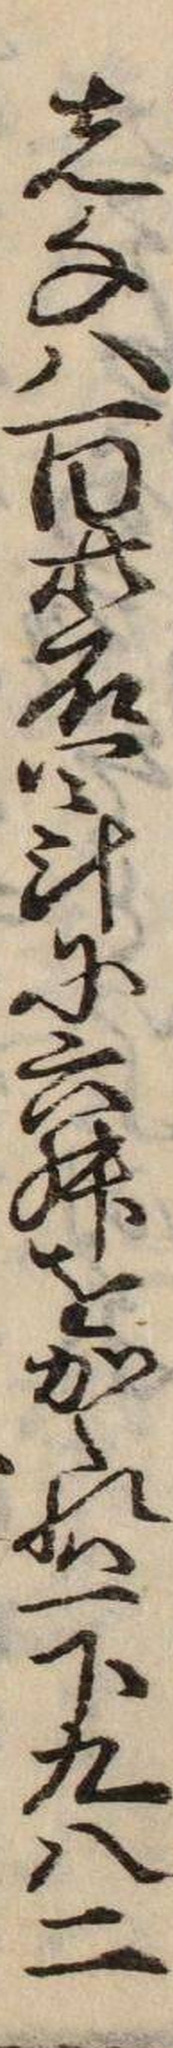先千八百卅石四斗に六舛をかくれは一下九八二
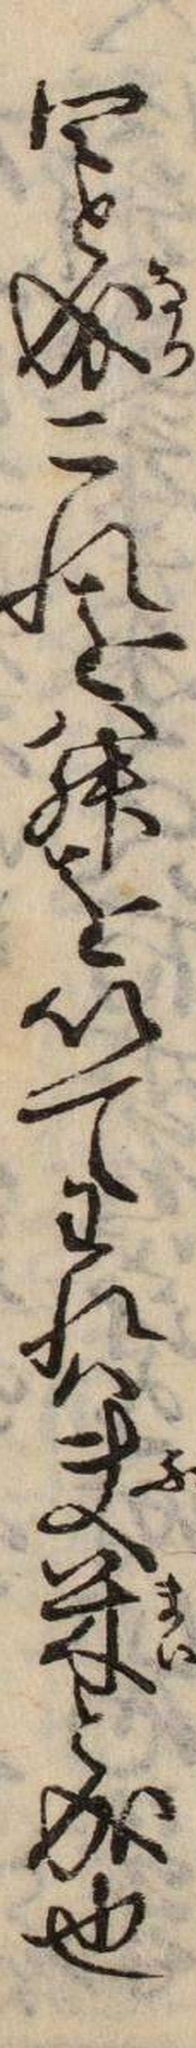四と成これを八舛を以てわれは夫米と成也
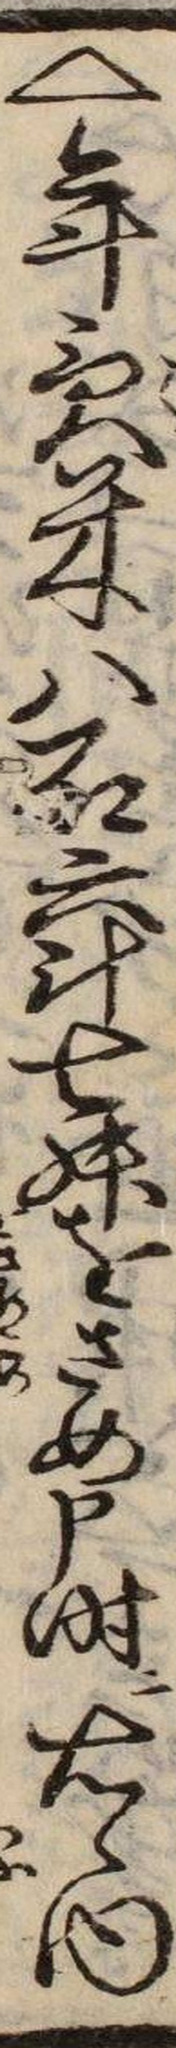△年具米八石六斗七舛をさめ申時に右の内
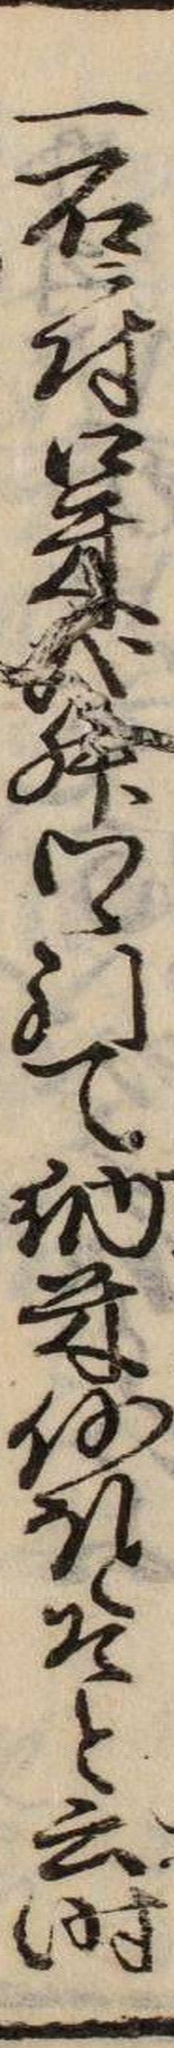一石に付口米弐舛つゝ引て納米何ほとそと云時
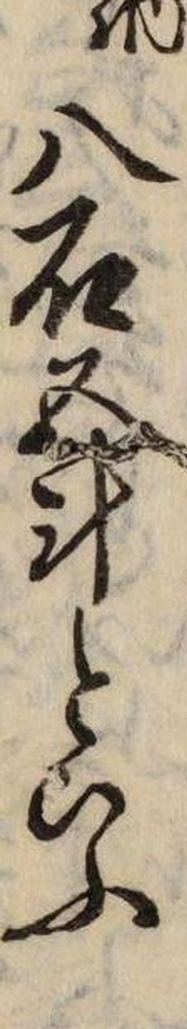納八石五斗といふ
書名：塵劫記（寛永11年自跋、京都府立京都学・歴彩館追貴8）
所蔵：京都府立京都学・歴彩館 国文学研究資料館
